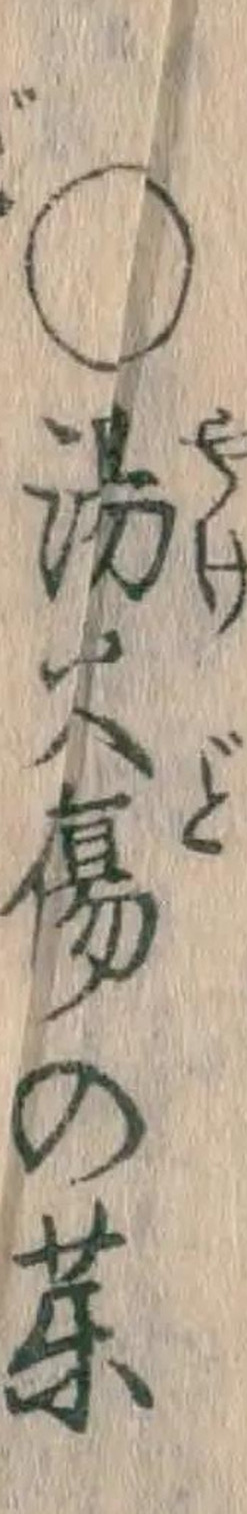○湯火傷の薬
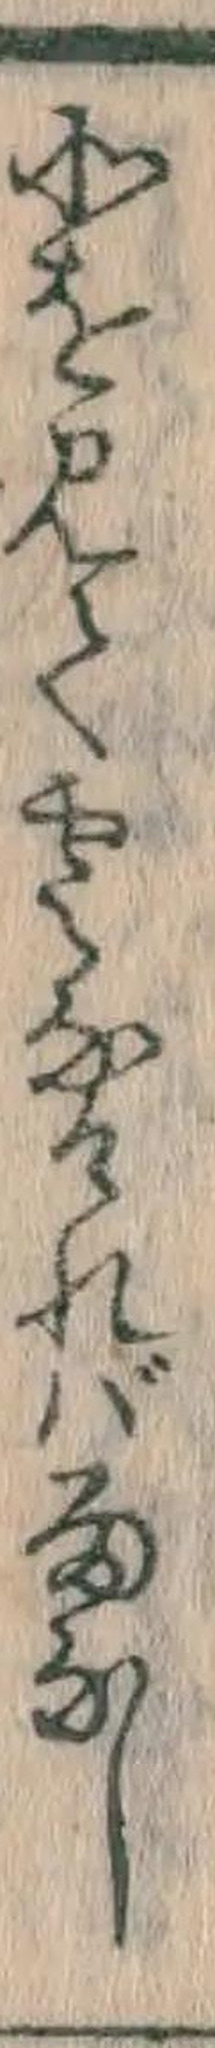北を見て雲なければ雨なし
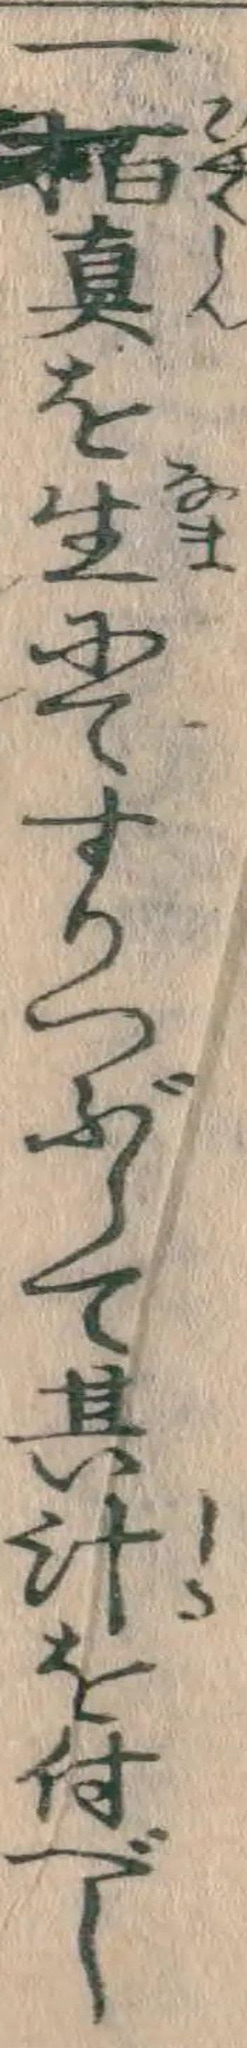一柏真を生にてすりつぶして其汁を付べし
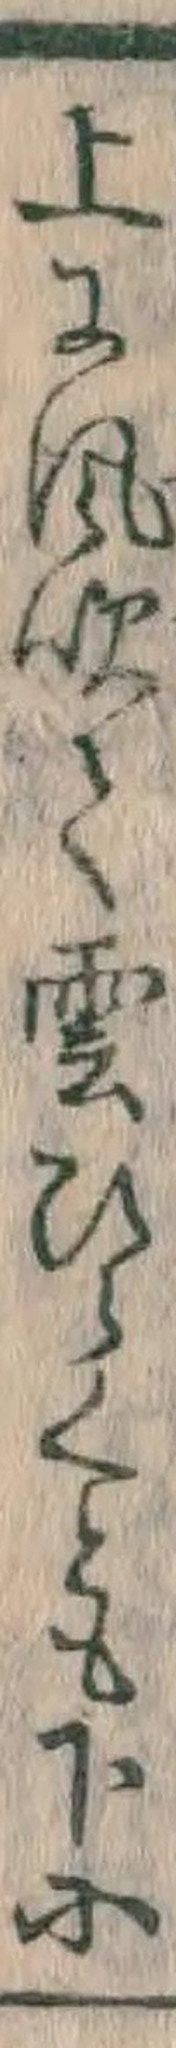上に風吹て雲ひらくとも下に
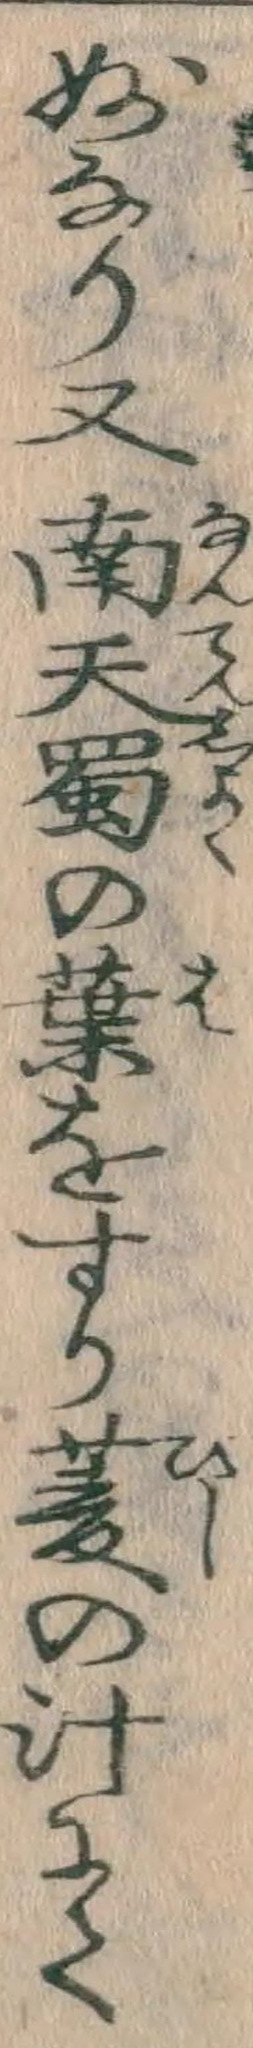妙なり又南天蜀の葉をすり菱の汁にて
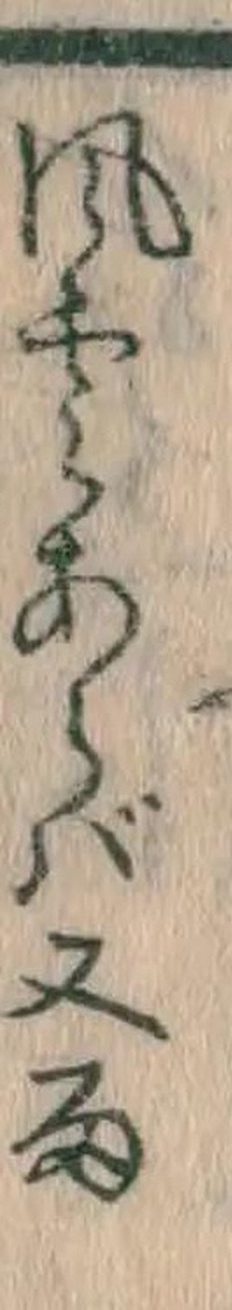風雲あらば又雨
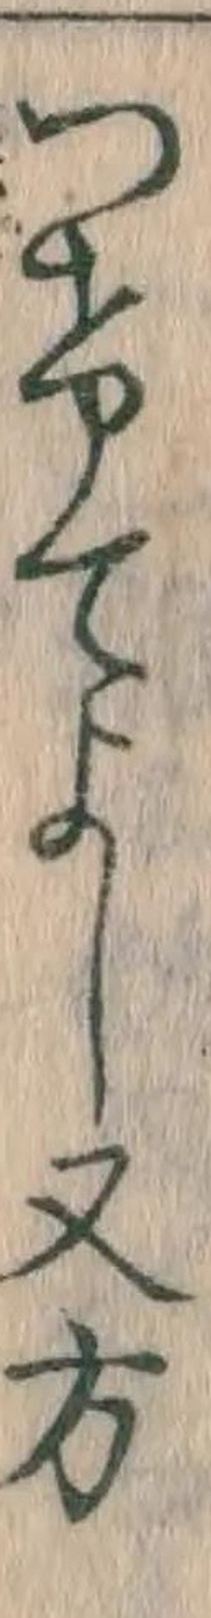つけてよし又方
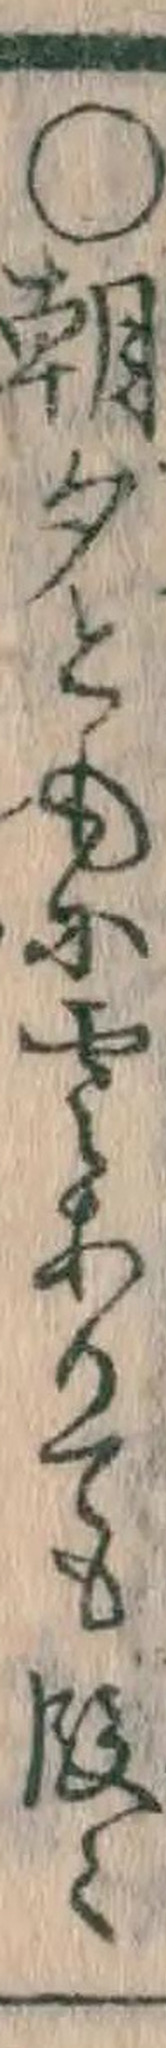○朝夕ともに雲ありても段々
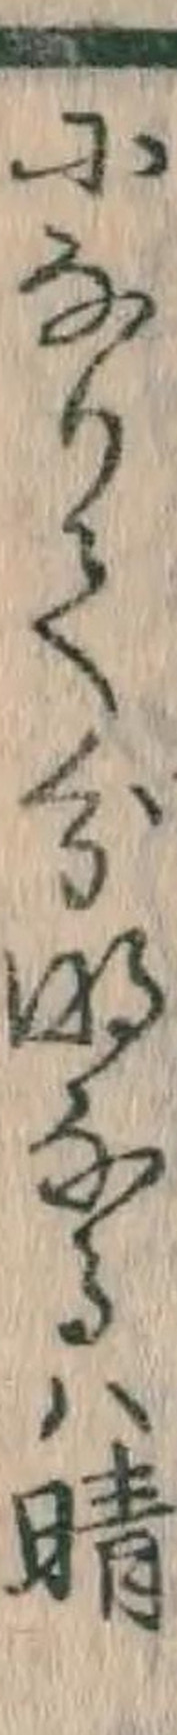になりて分明なるは晴
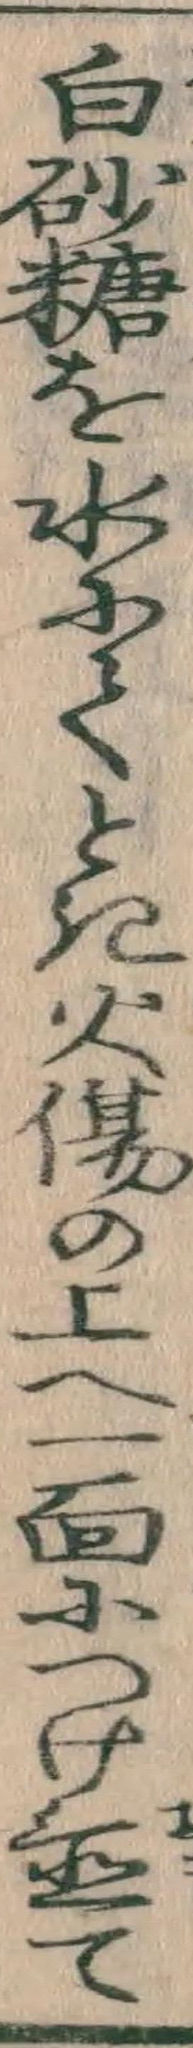白砂糖を水にてとき火傷の上へ一面につけ置て
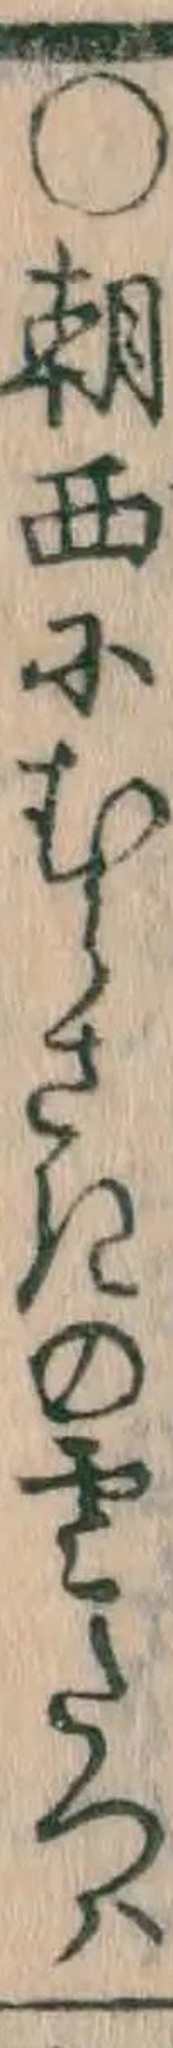○朝西にむらさきの雲たつは
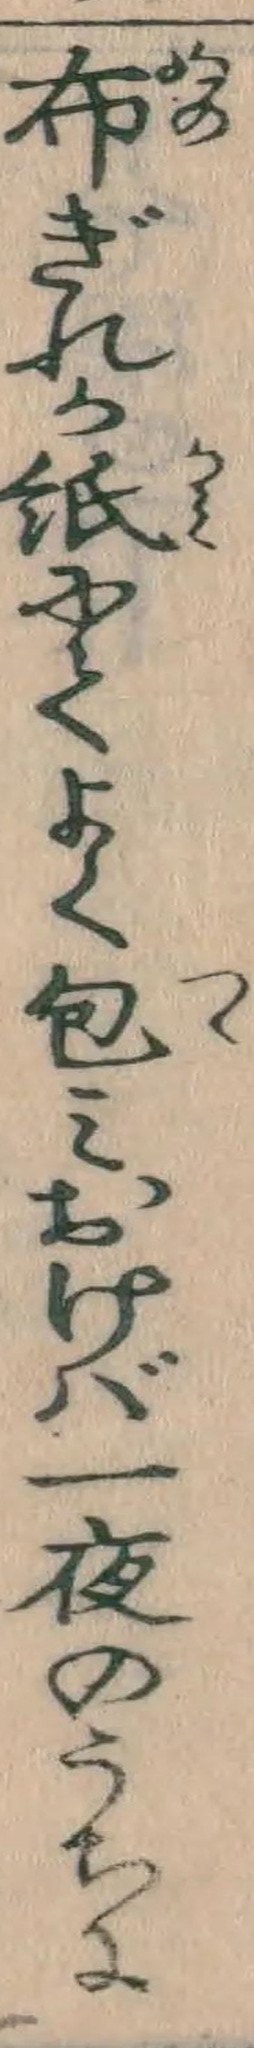布ぎれか紙にてよく包みおけば一夜のうちに
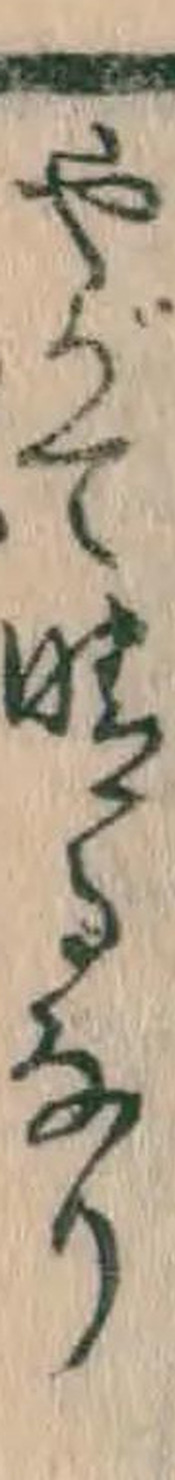やがて晴るなり
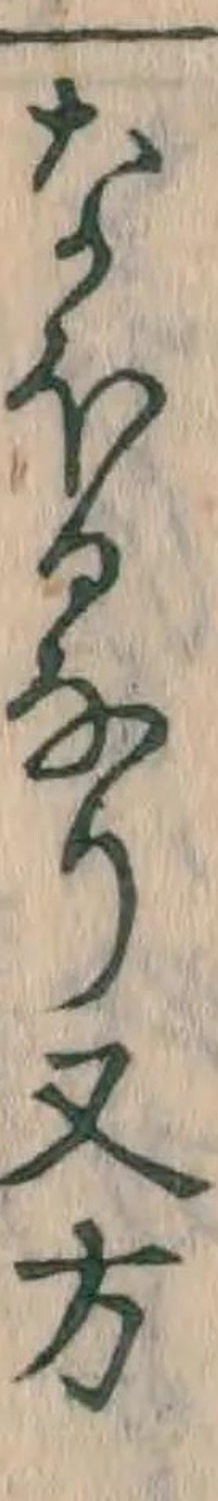なほるなり又方
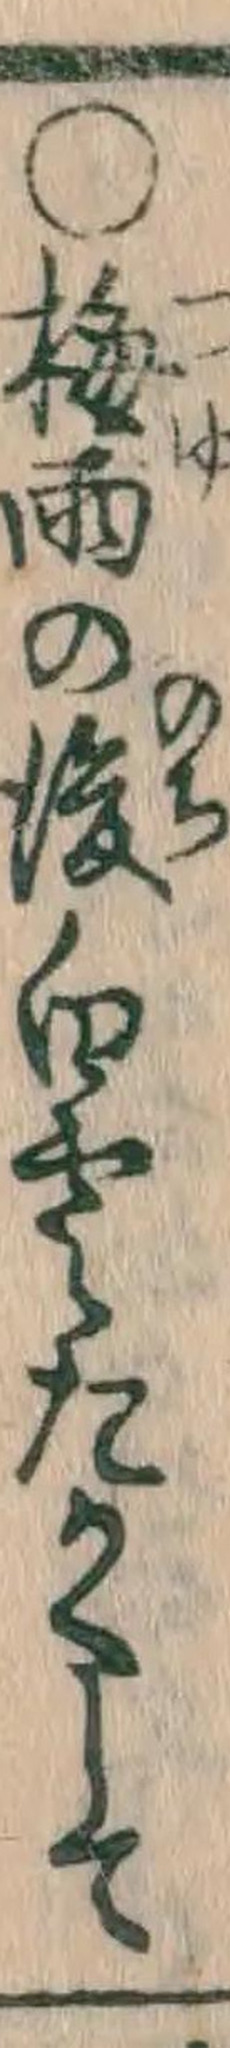○梅雨の後白雲たかくして
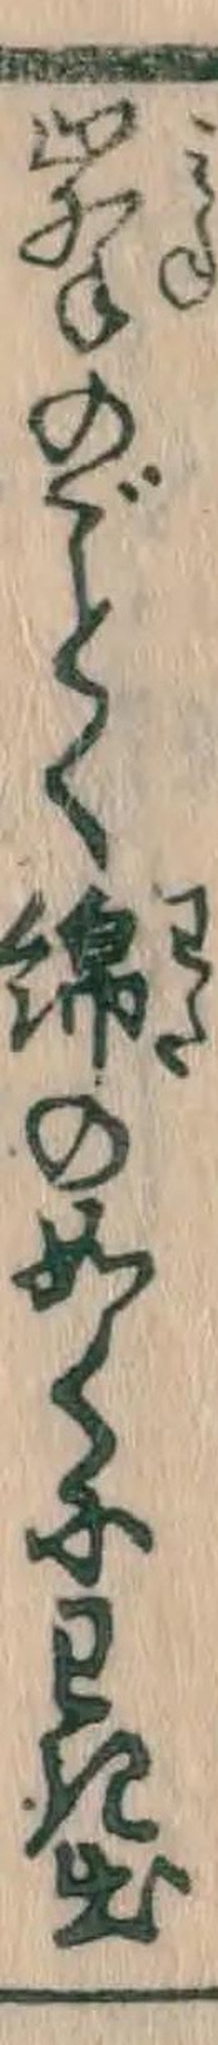峰のごとく綿の如くにわき出
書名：広益秘事大全 3巻. [4]
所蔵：国立国会図書館 National Diet Library, JAPAN
